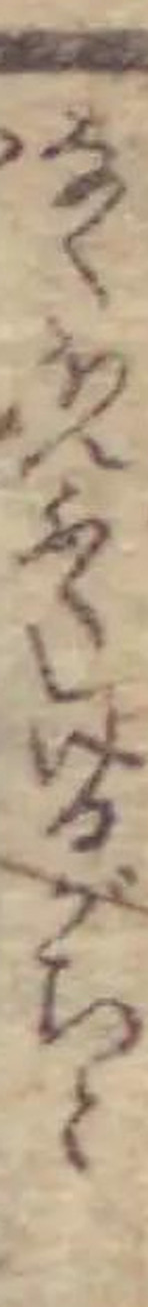なくほんふくしけるがちと
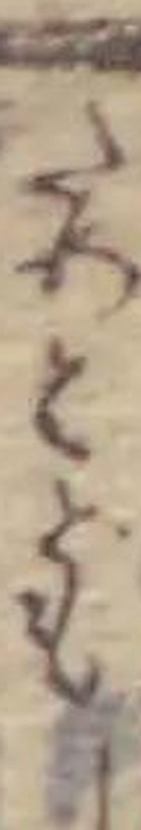ためととも
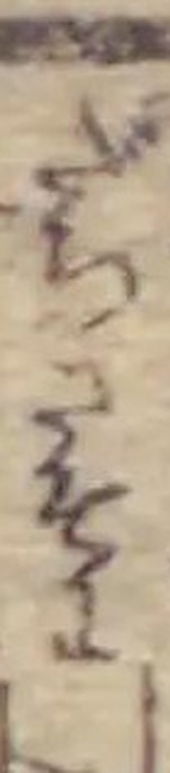だちさそわ
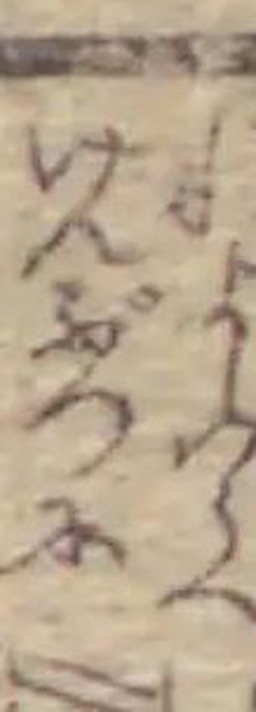けんぶつに
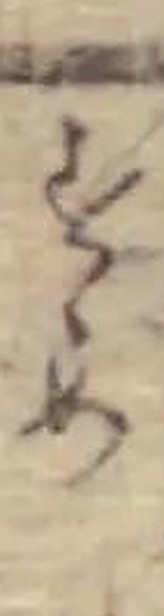すゝめ
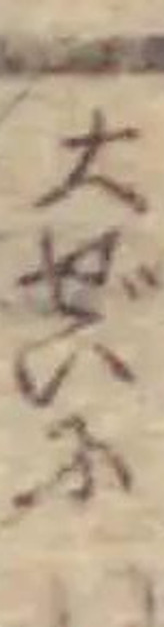大ぜいに
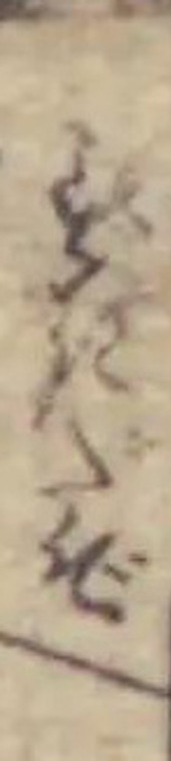すきだぞ
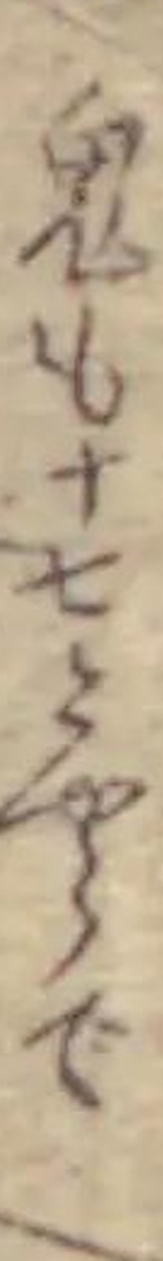鬼も十七とやらで
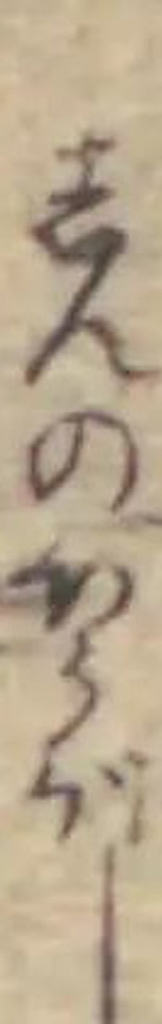しんのほうが
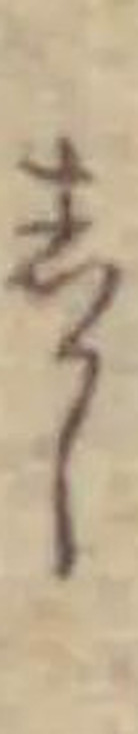しかし
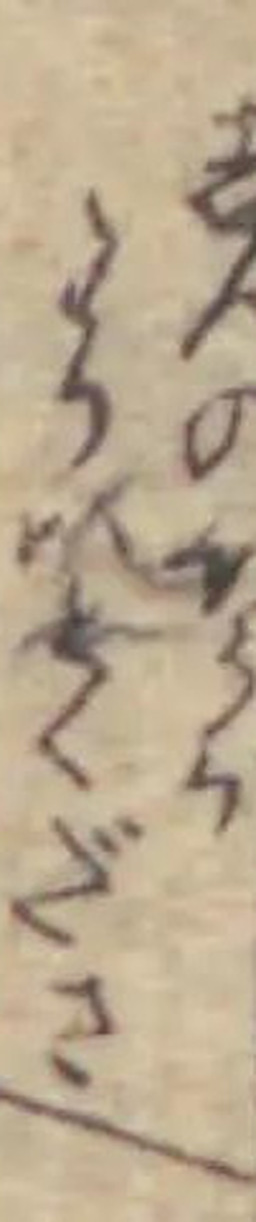わりはとくださ
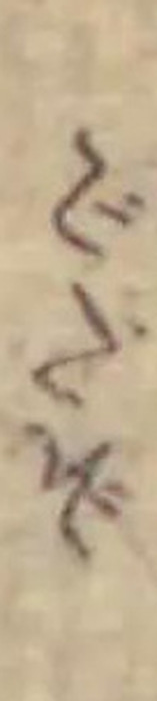でだぞ
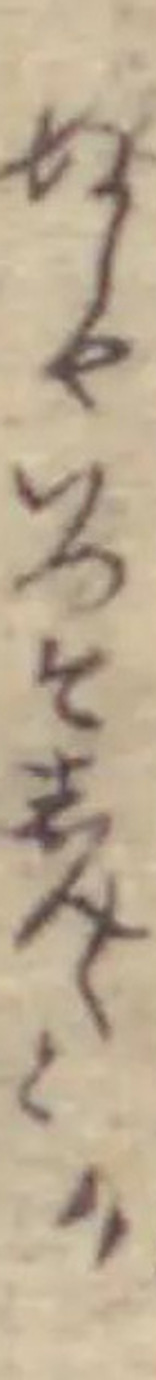ぬしやいつそしん〳〵と
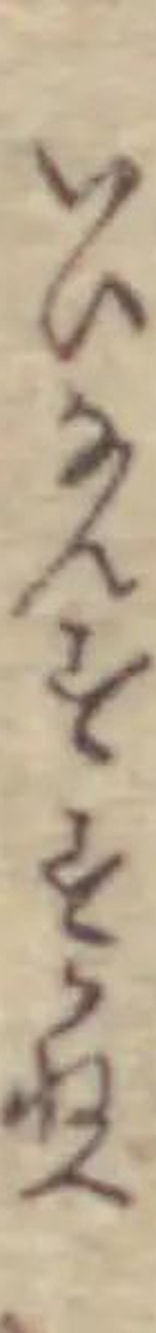いひなんすすかねへ

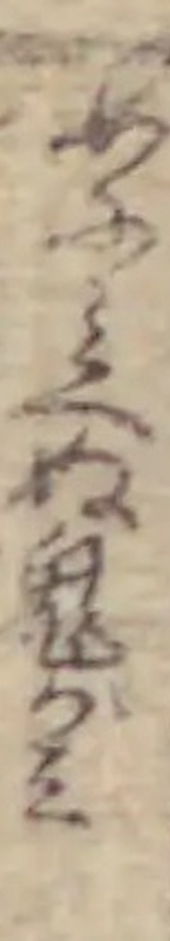めにみへぬ鬼がみ
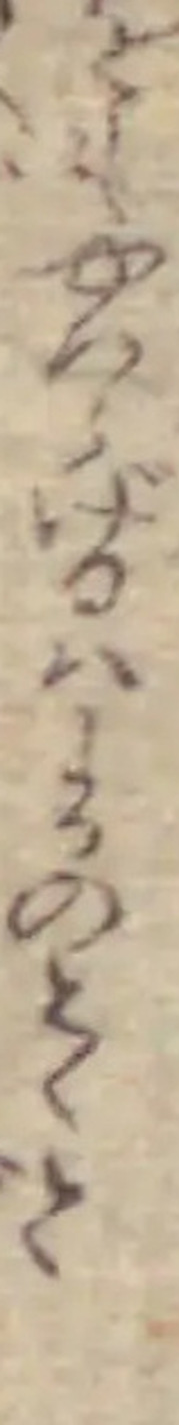をもやはらげるはわかのとくと
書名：鬼子宝 3巻
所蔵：国立国会図書館 National Diet Library, JAPAN
